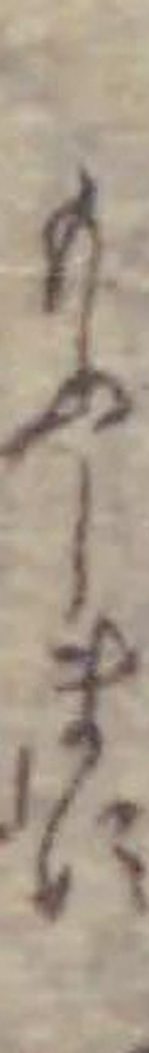もふします
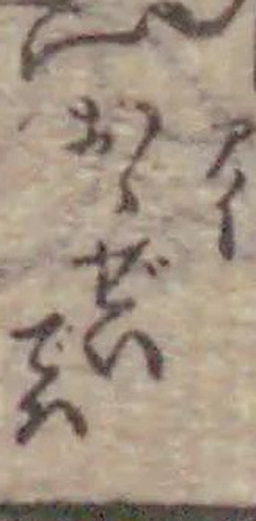おゝぜい
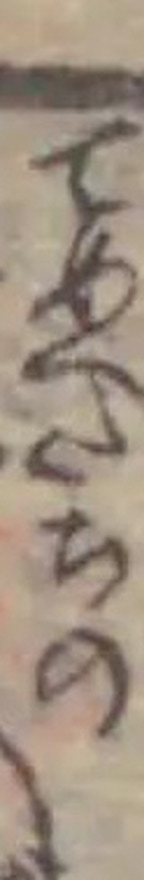てめへたちの
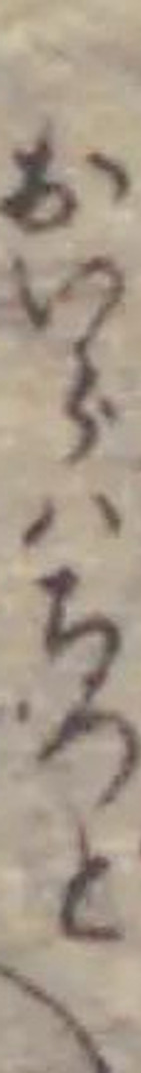おいらはちつと
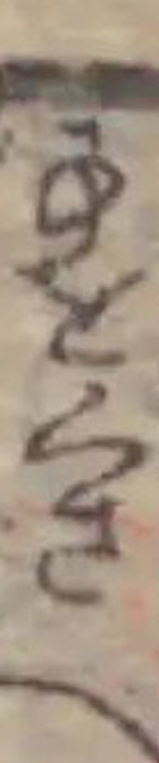事をくさ
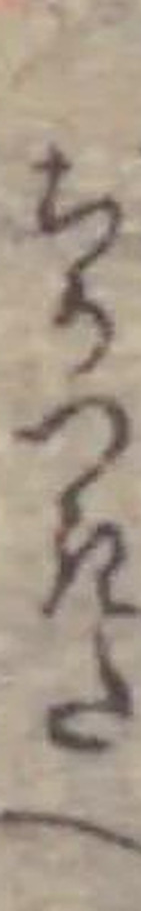ちかつきた
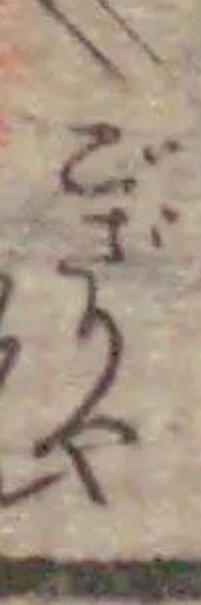ござりや
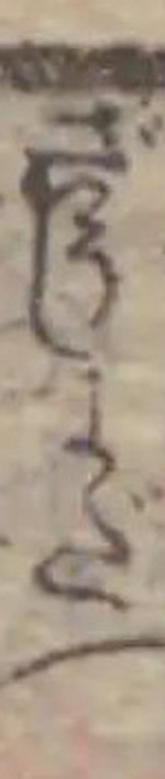ざうしにだ
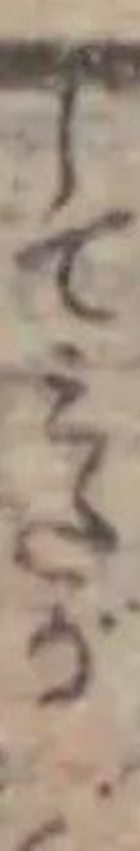してみたが
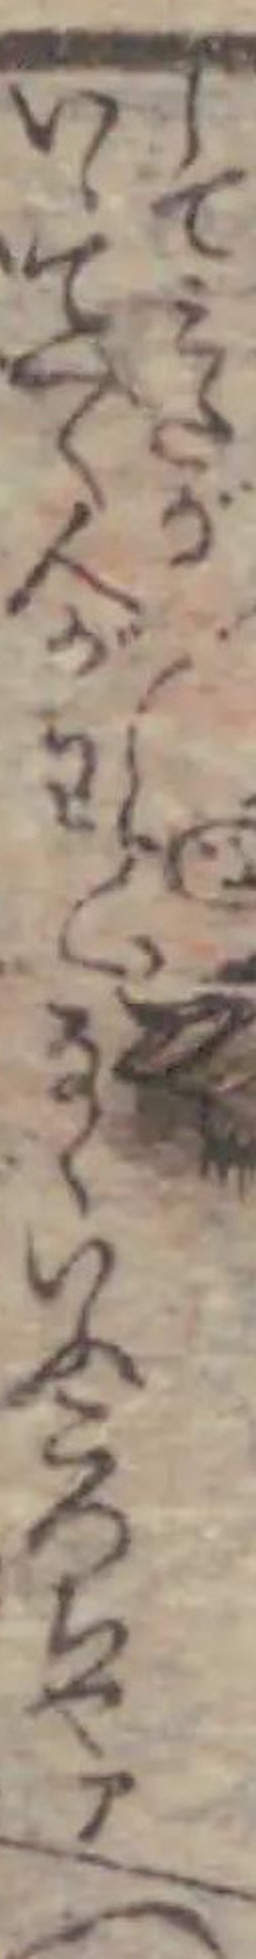いゝてへ〳〵人がわるくいふこつちやァ
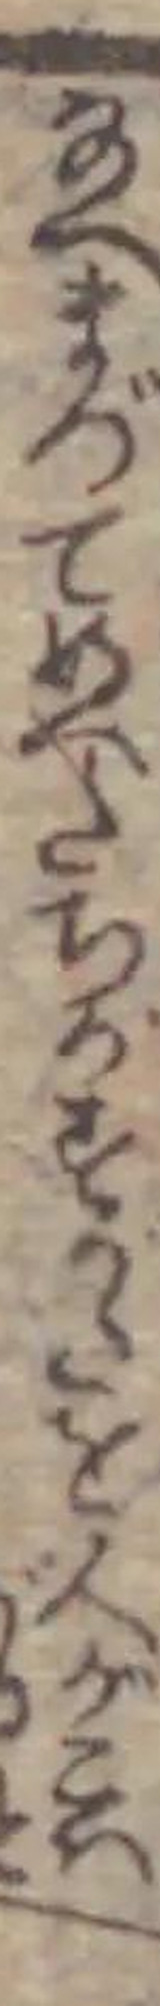なへまづてめへたちがすがたを人がこは
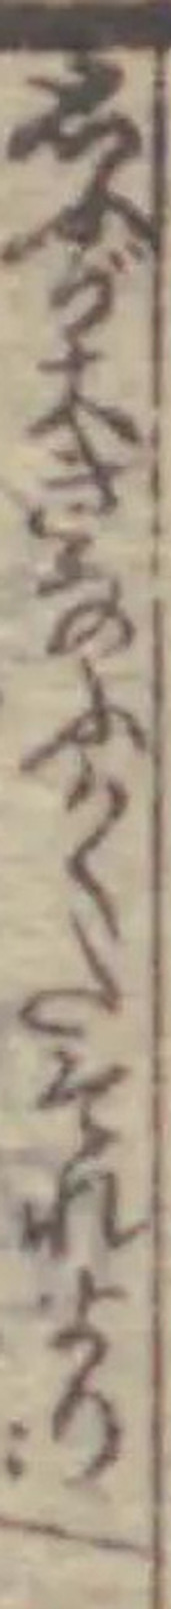思ふが大きなふかくたそれより
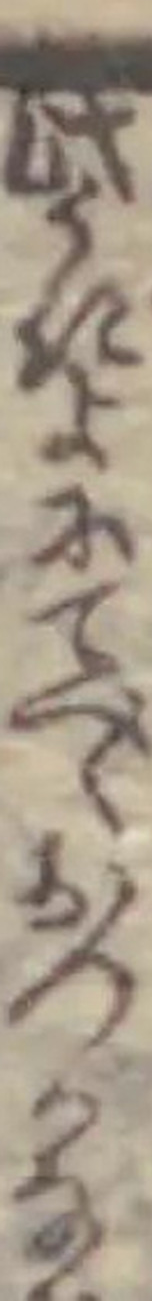此うきよにてへ〳〵おつかなひ
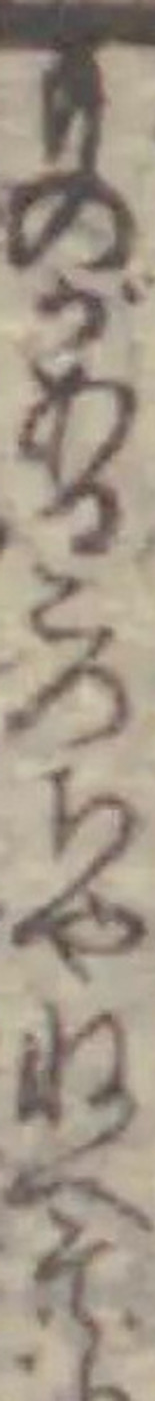ものがあるこつちやねへそふ
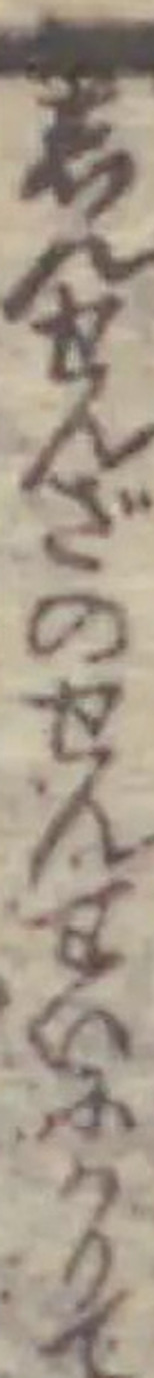しんせんざのせんせいにかりて
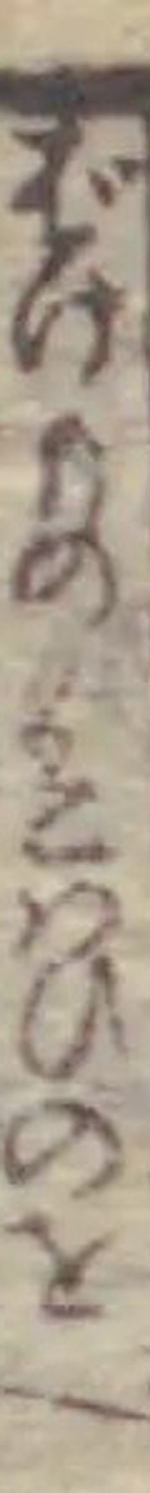ばけものよりこはひのを
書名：化物大閉口 2巻
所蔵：国立国会図書館 National Diet Library, JAPAN
